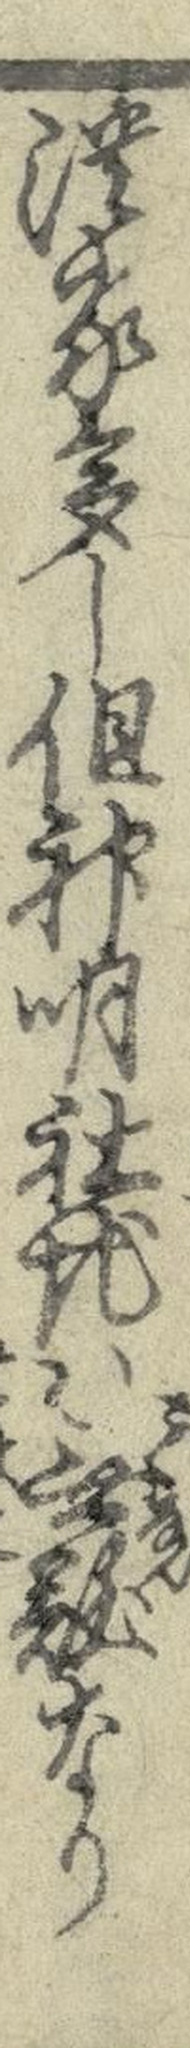潰家多し但神明社地は無難なり
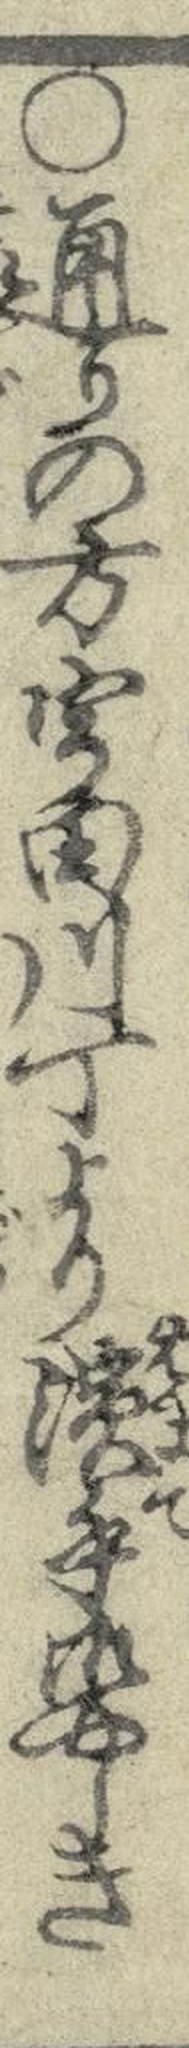〇通りの方宇田川丁より浜手御やしき
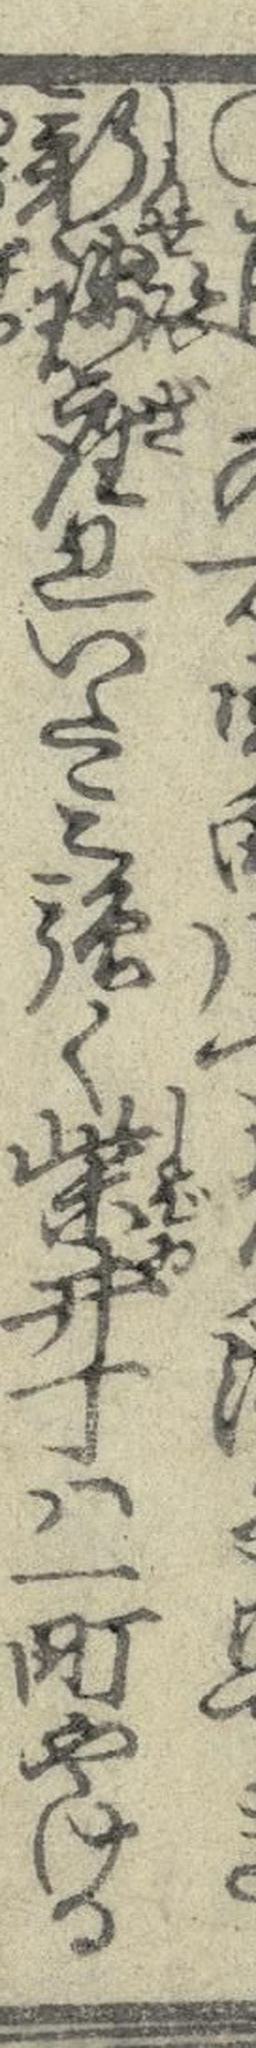新銭座辺いたみ強く柴井丁は一町やける
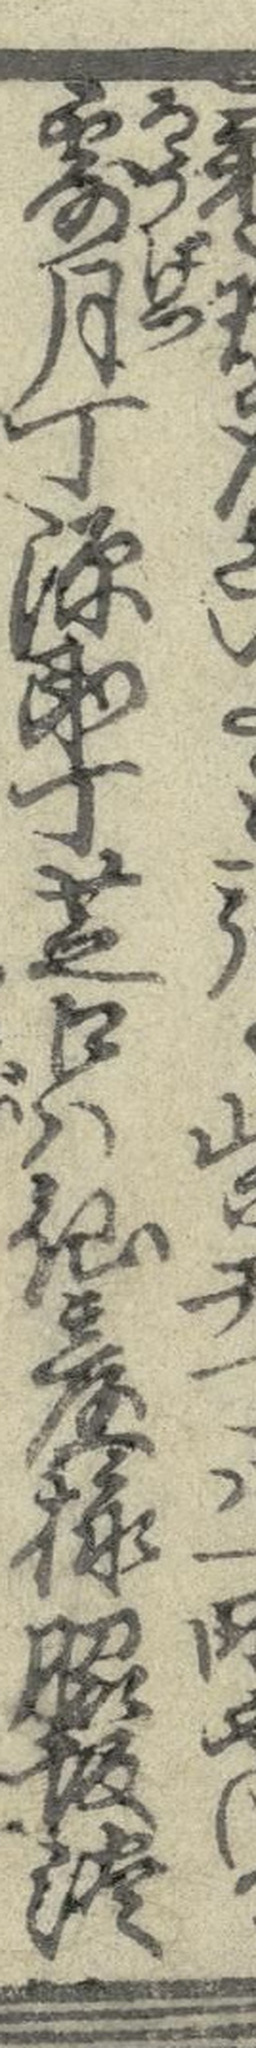露月丁源助丁芝口は仙台様脇坂淡
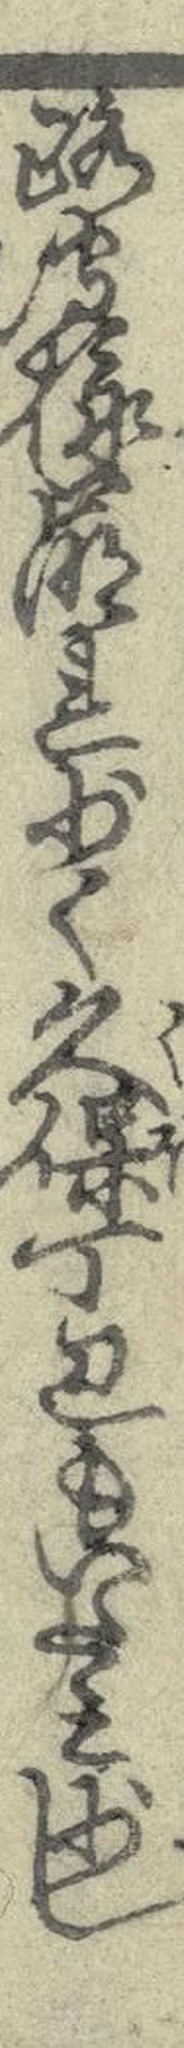路守様崩れ少く久保丁辺もいたみ少し
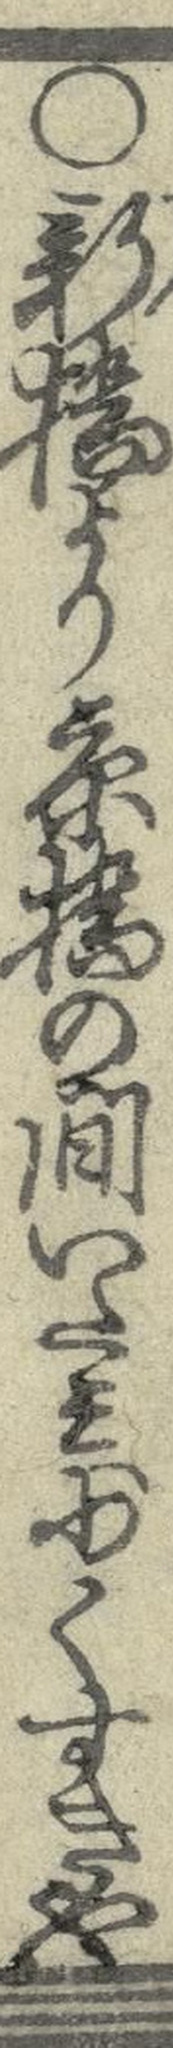〇新橋より京橋の間いたみ少くすきや
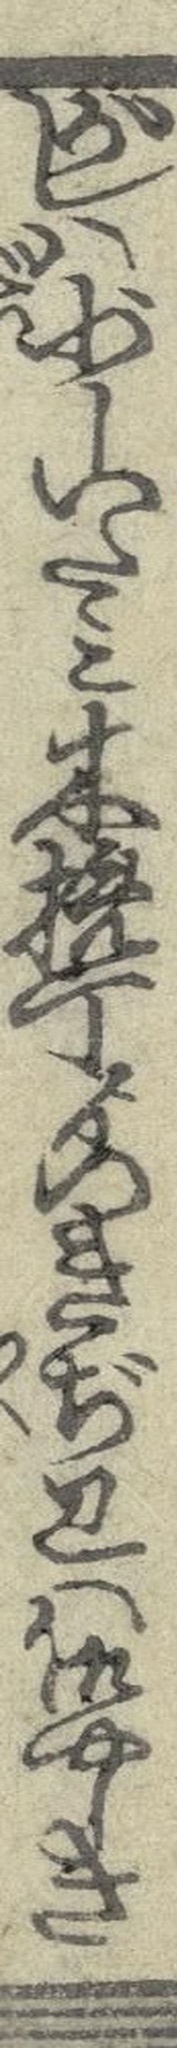ばしは少しいたみ木挽丁ゟつきぢ辺は御やしき
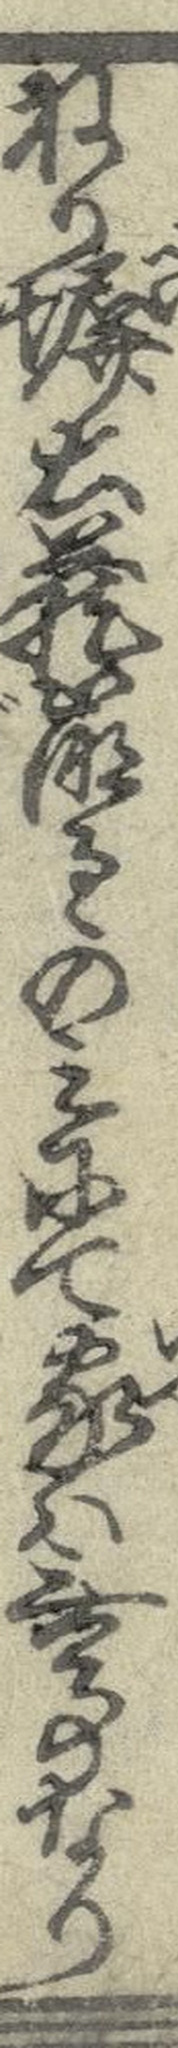ねり塀土蔵崩るゝのみにて家は無事なり
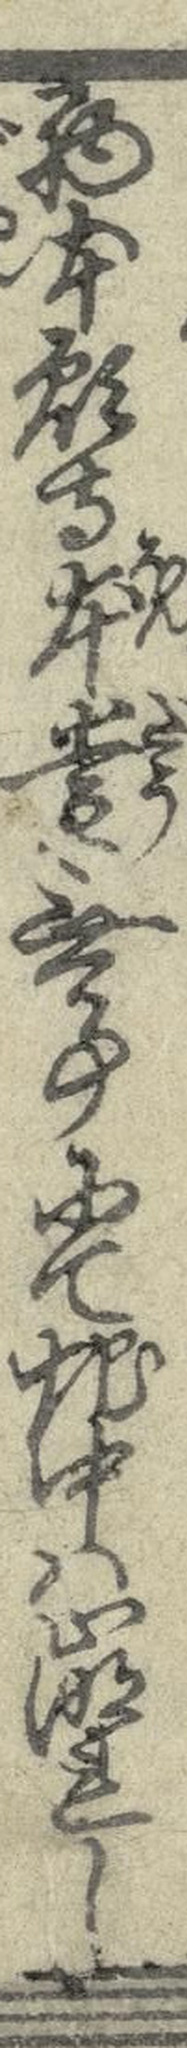西本願寺本堂無事にて地中は崩れし
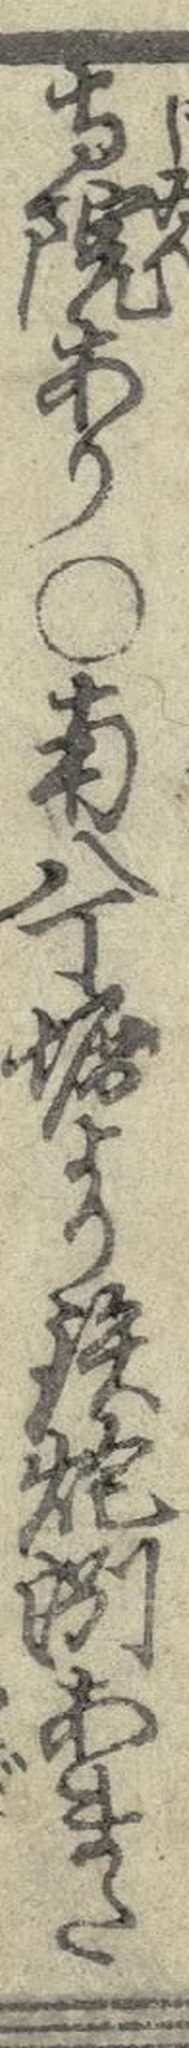寺院あり〇南八丁堀より鉄砲洲あまた
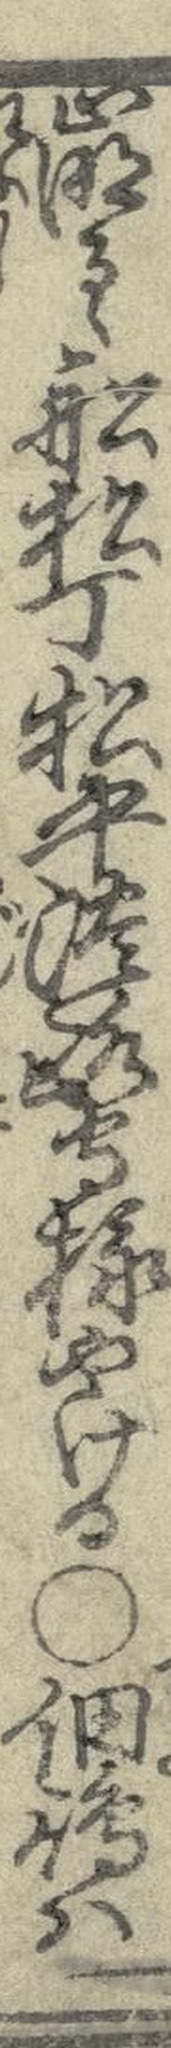崩るゝ船松丁松平淡路守様やける〇佃嶋は
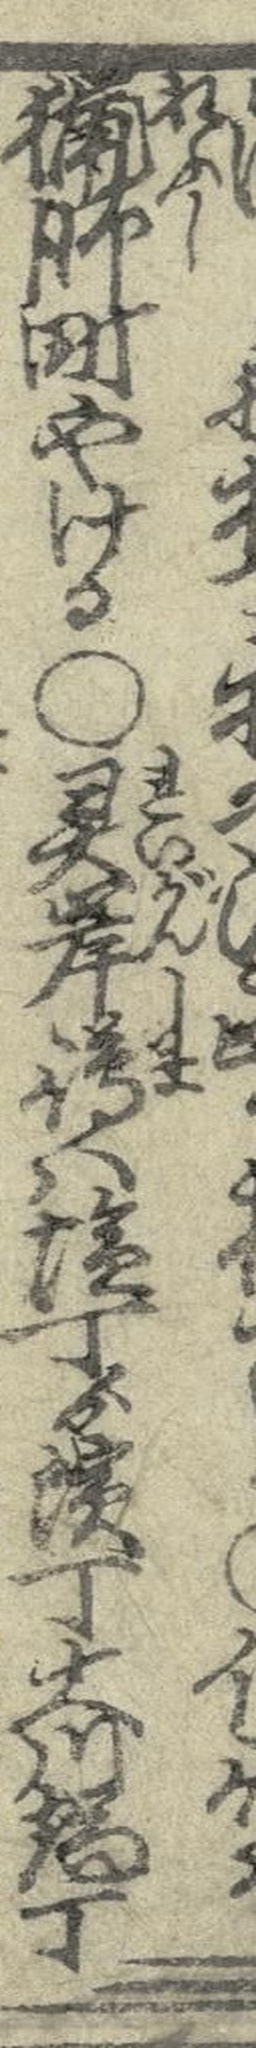猟師町やける〇霊岸嶋は塩丁ゟ浜丁大川端丁
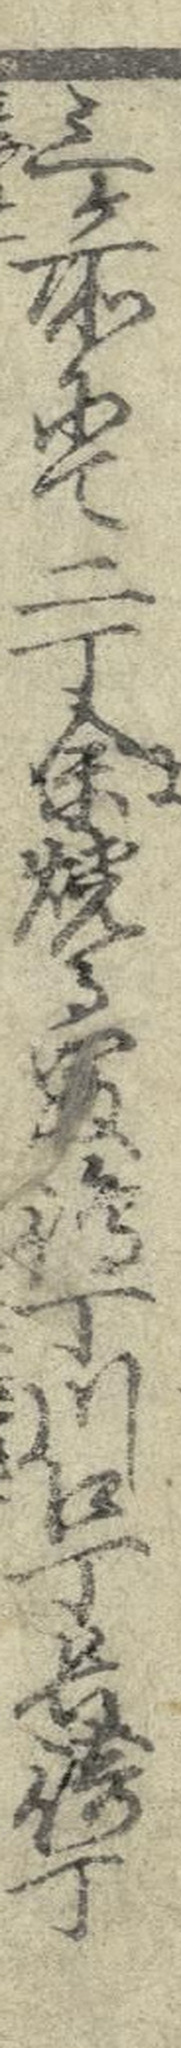三ヶ所にて二丁余焼る富島丁川口丁長崎丁
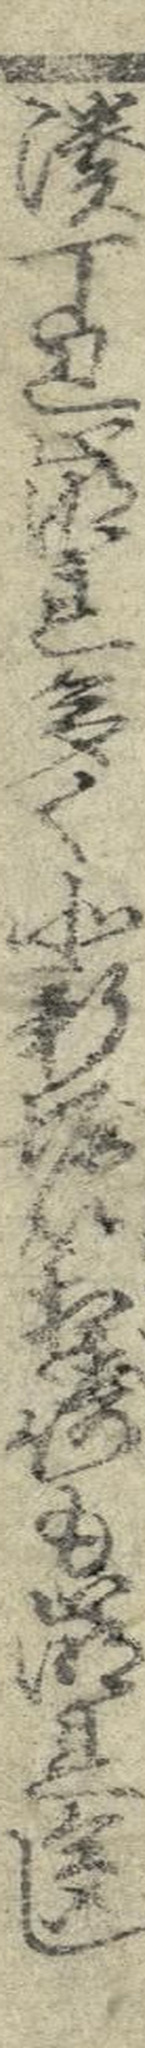湊丁辺崩れ多く北新堀箱崎も崩れ多し

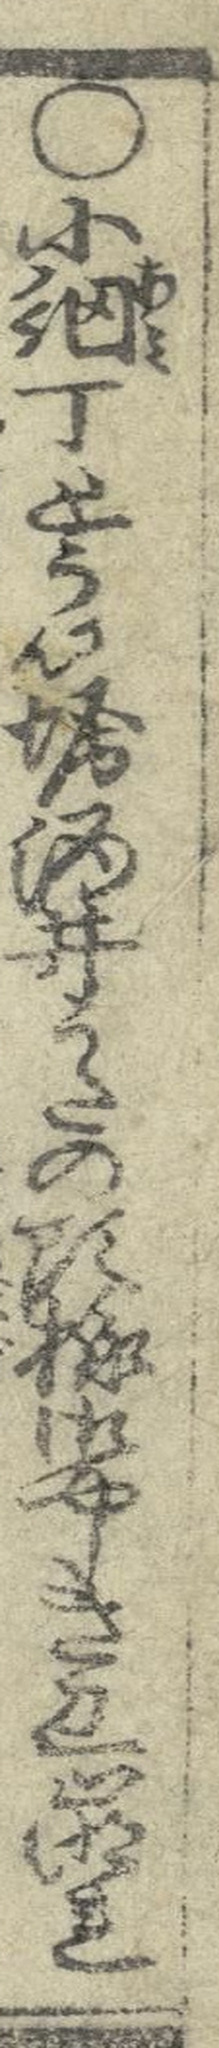〇小網丁とうかん堀酒井うたの頭様御やしき辺崩れ
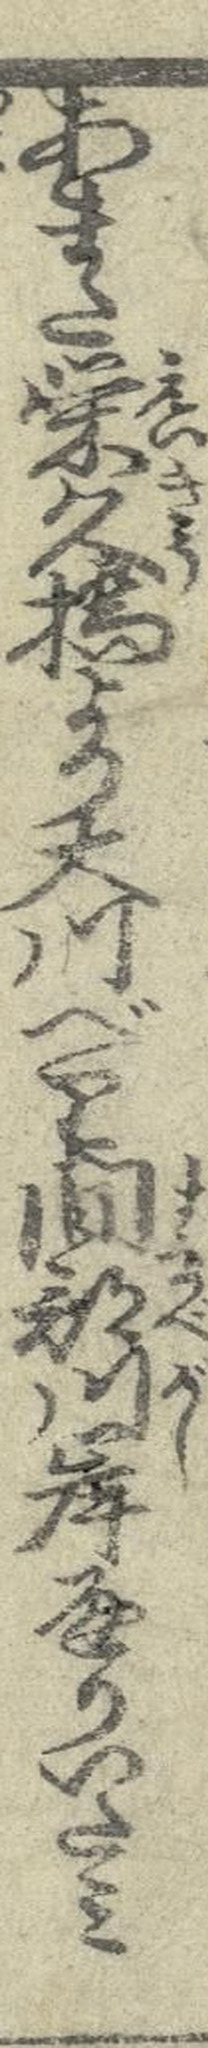あまた栄久橋より大川べり間部川岸通りいたみ
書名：地震並出火細見記
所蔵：東京大学地震研究所図書室 Earthquake Research Institute Library, The University of Tokyo, JAPAN
